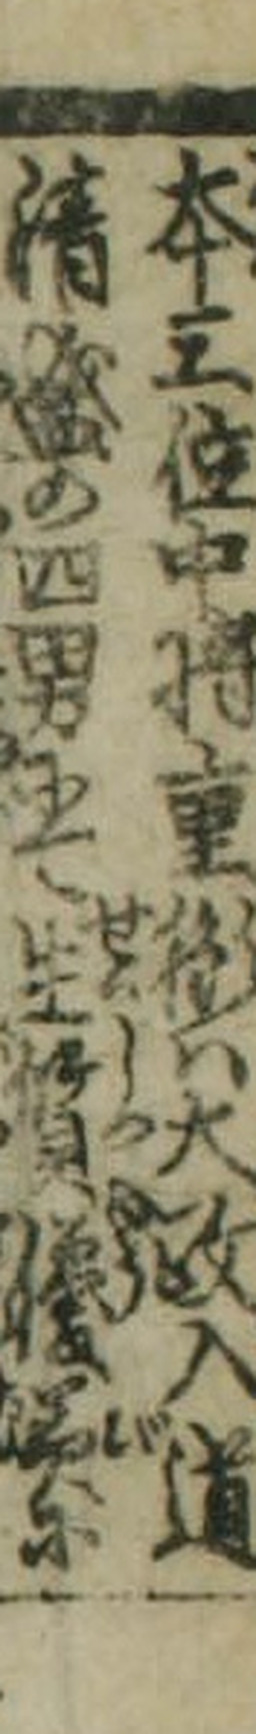清盛の四男にて生質優美に
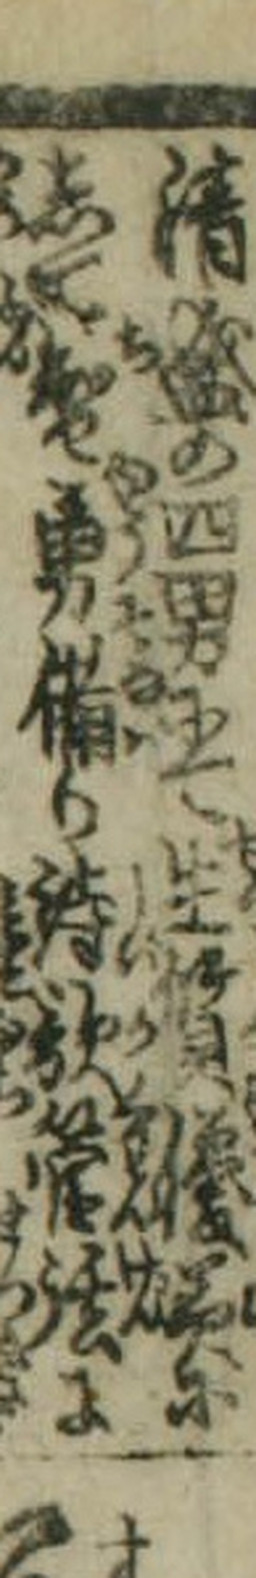して智勇備り詩歌管弦に
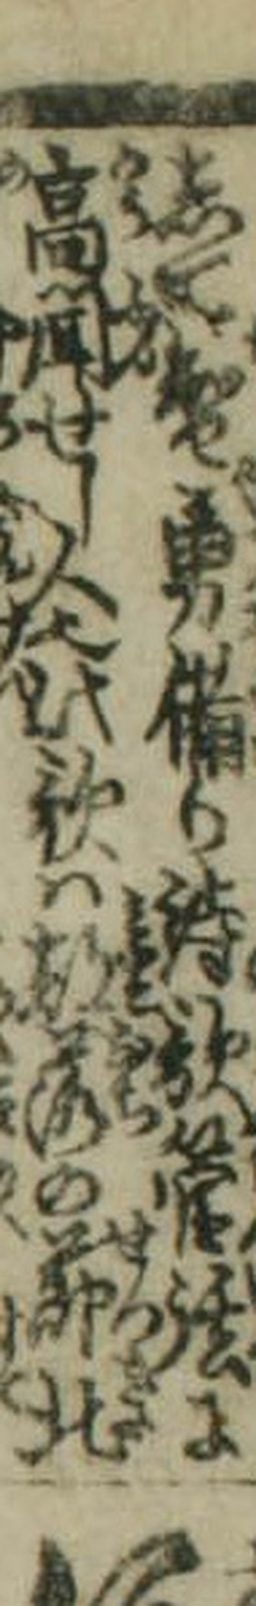高聞せし人也此歌は都落の節北
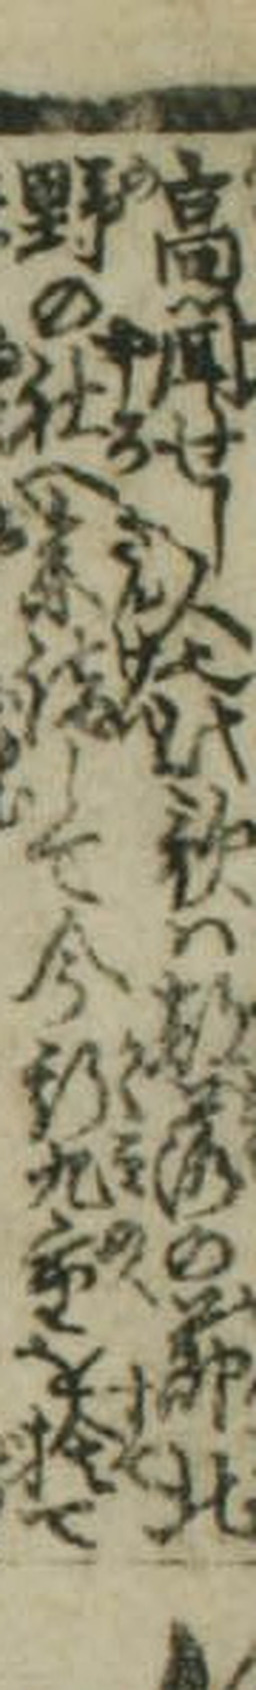野の社へ参詣して今斯九重を捨て
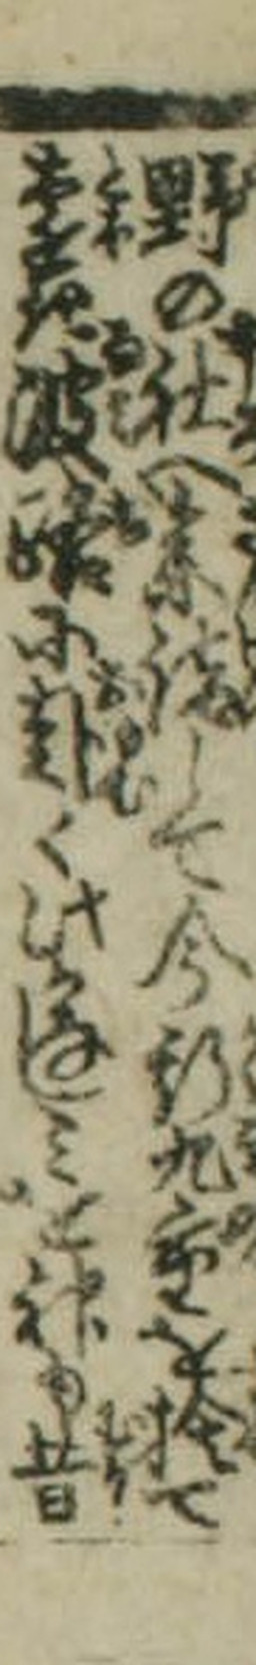遠き波路に赴く此かなしみを神も昔
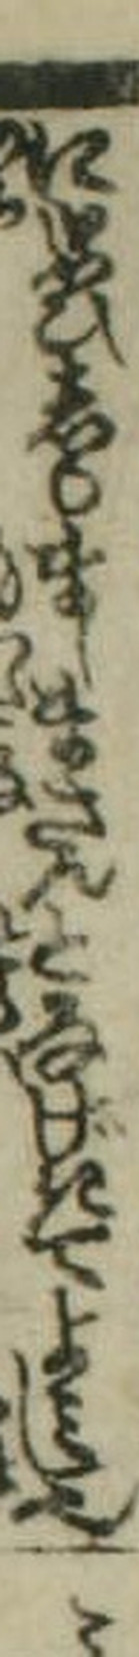に思ひしもましまさんとなげきてよみし也
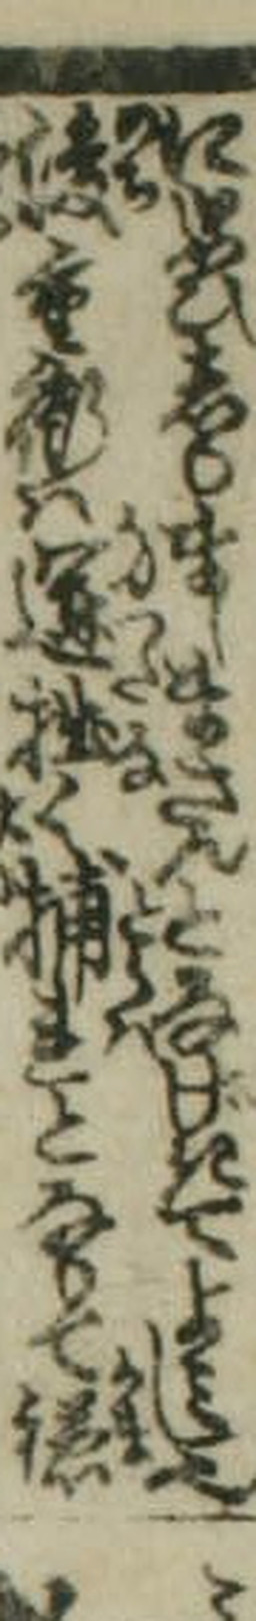後重衡は運拙く捕れとなりて鎌
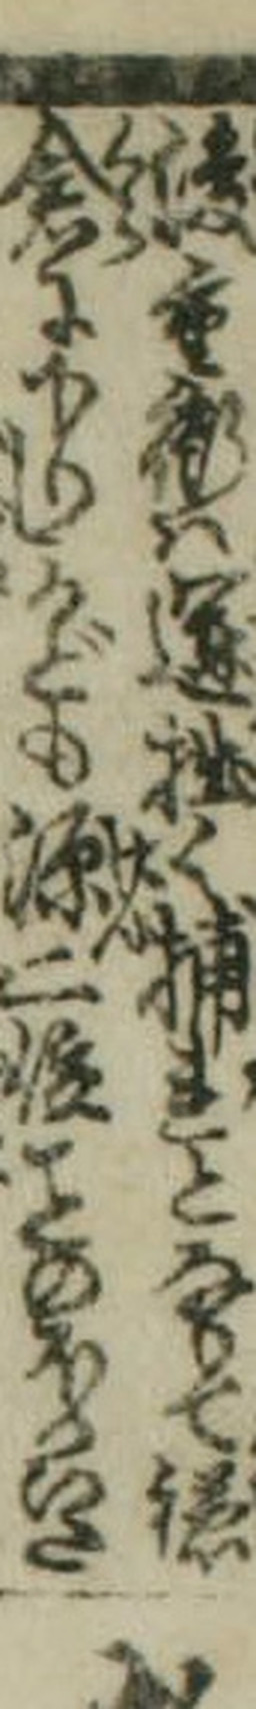倉に下りしかども源二位ことのほかいた
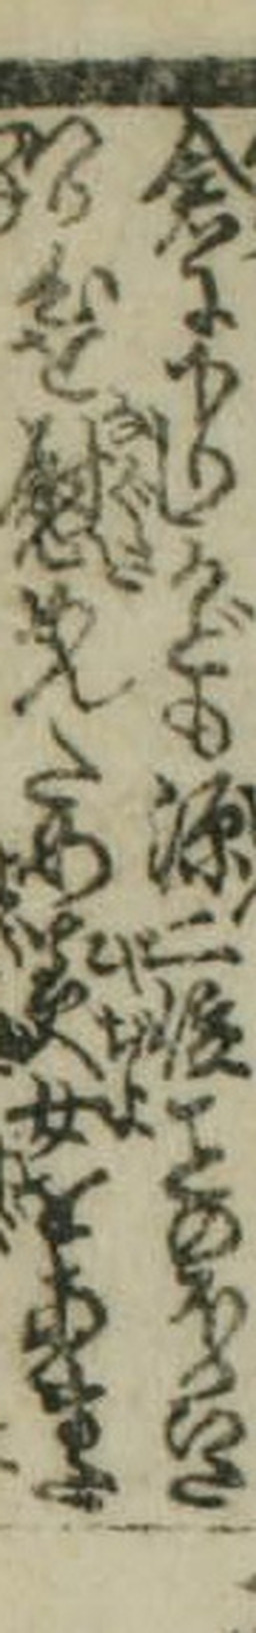はり心を慰めんため美女をあまた
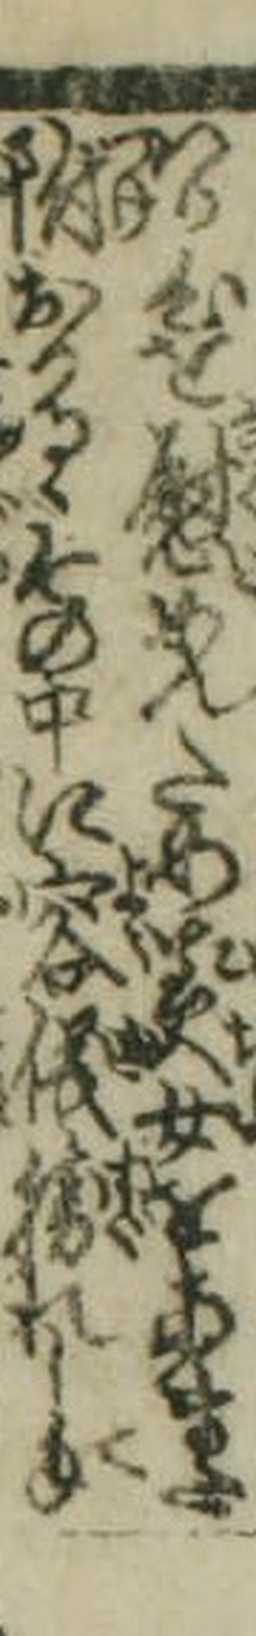附おかるゝその中に容儀勝れし手
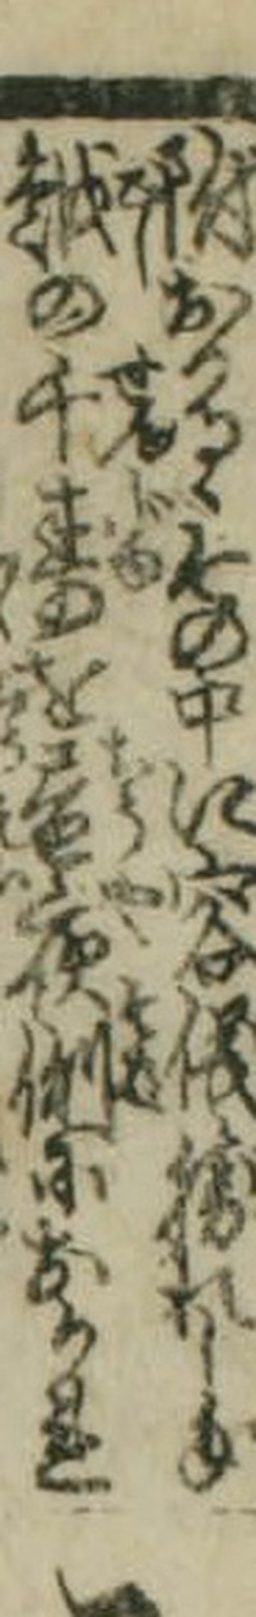越の千寿を昼夜側におかれ
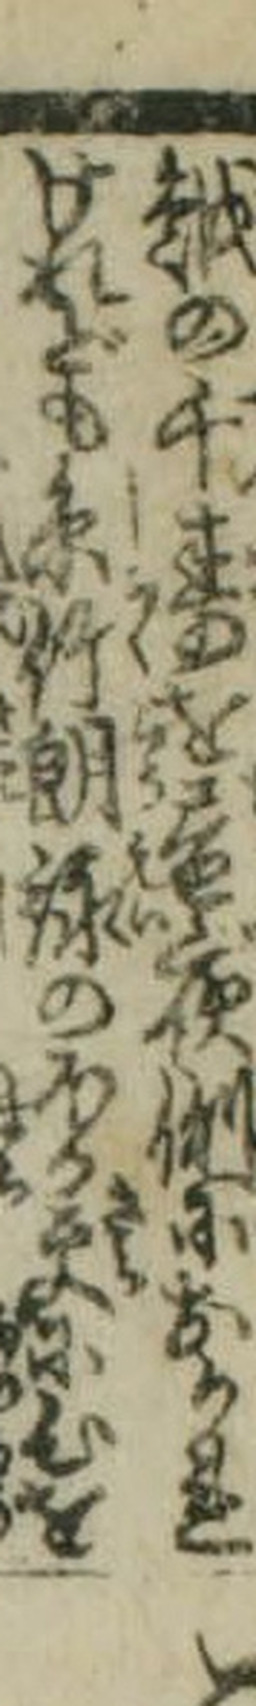けれども糸竹朗詠のほか更に心を
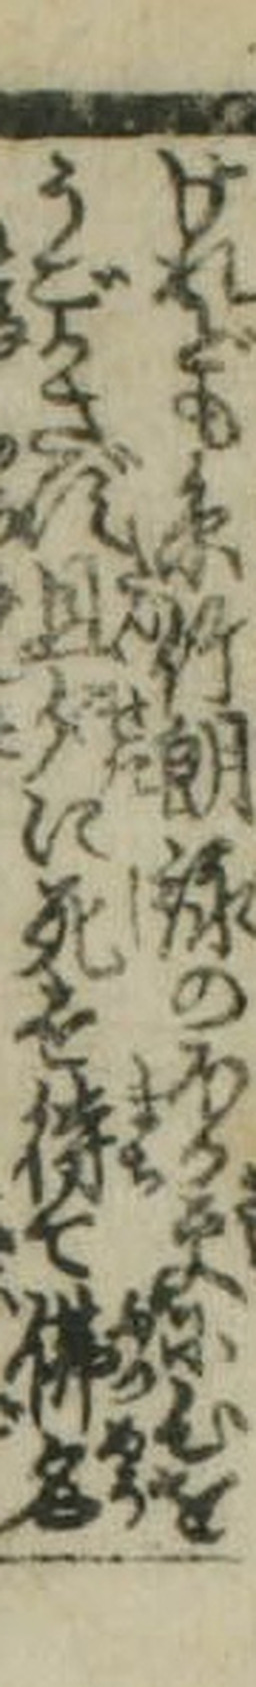うごかさず旦夕に死を待て仏名
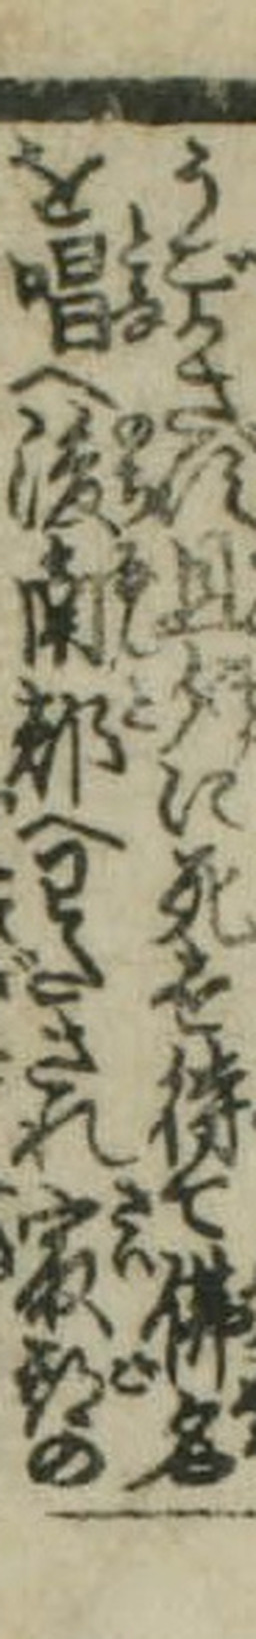を唱へ後南都へわたされ最期の
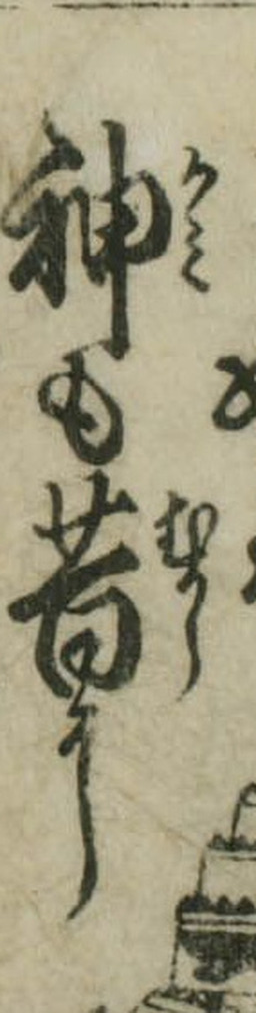神も昔に
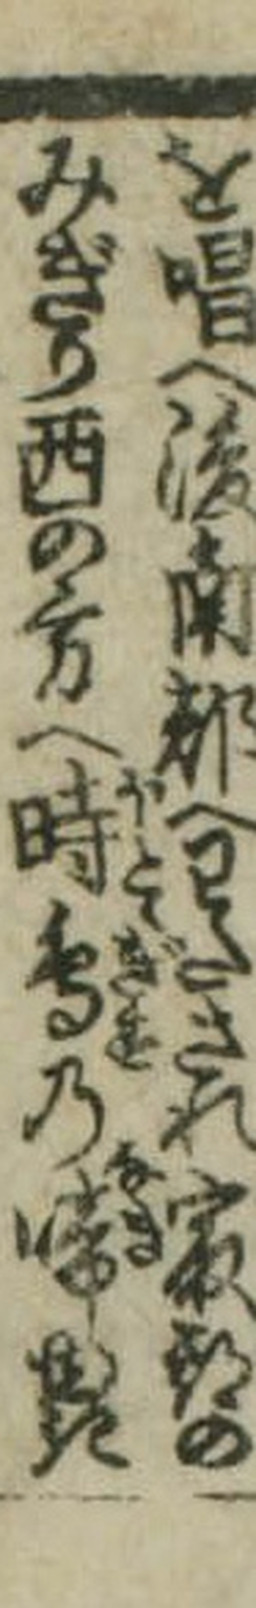みぎり西の方へ時鳥の啼ゆき
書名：續英雄百人一首
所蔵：東京学芸大学附属図書館
